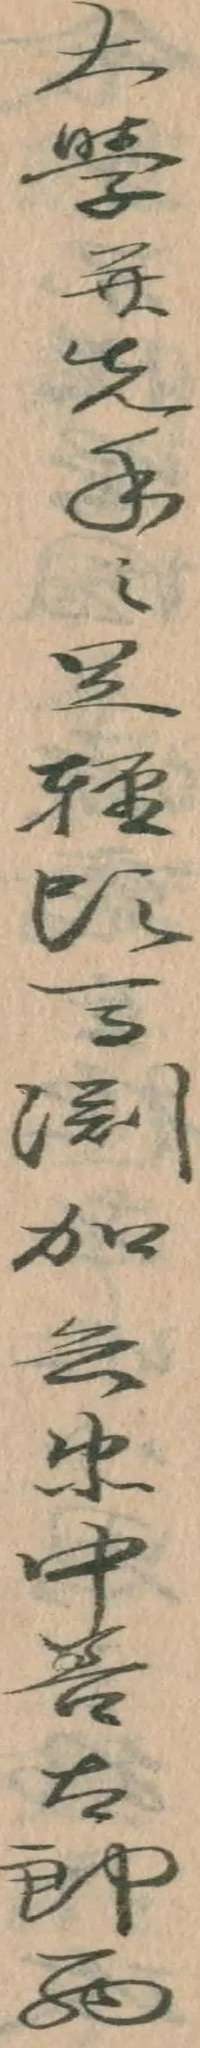大学幷先手之足軽頭馬淵加兵衛中善太郎西
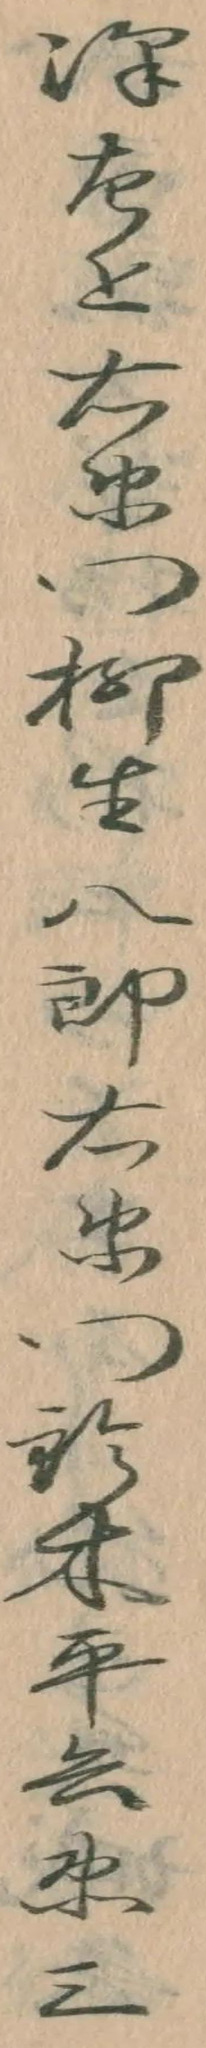沢左近右衛門柳生八郎右衛門鈴木平兵衛三
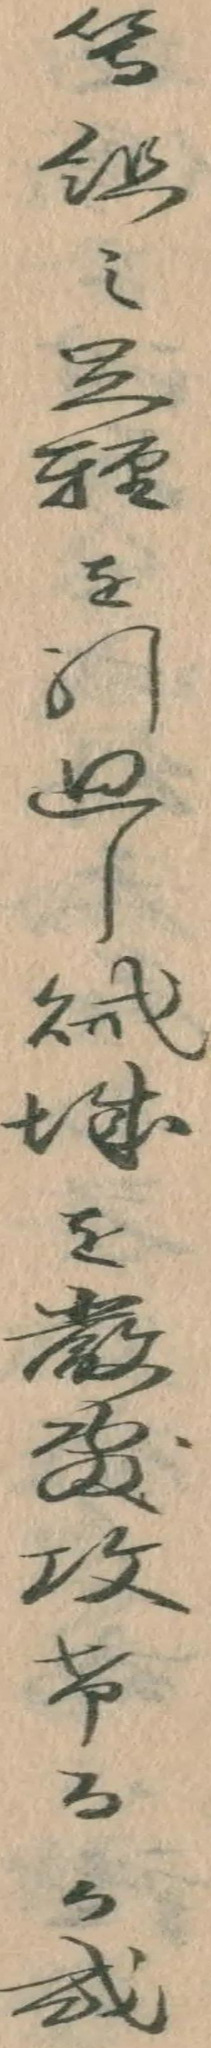等組之足軽を引廻し賊城を厳敷攻希るか或
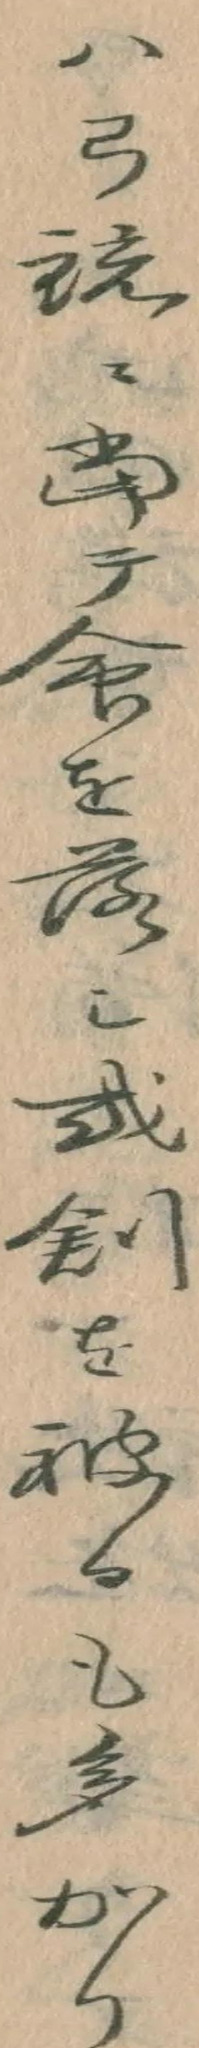は弓鏡に当て命を落し或創を被るも多かり
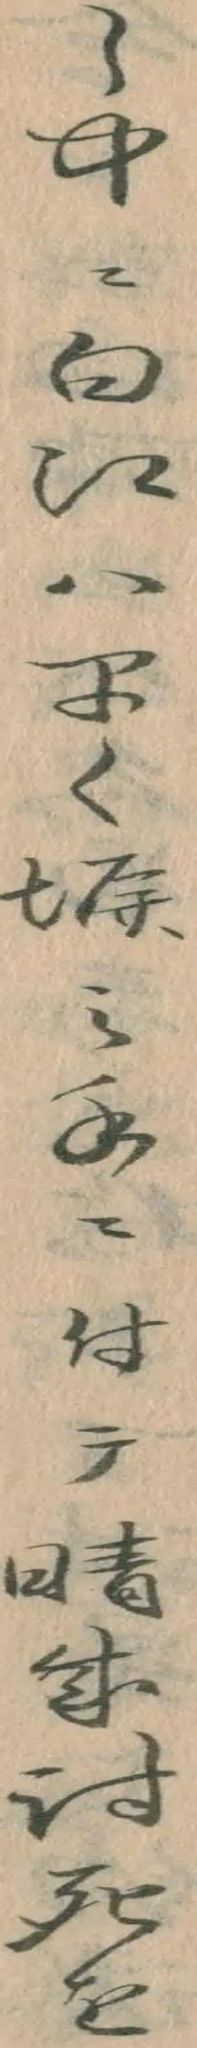し中に白江は早く塀之手に付て晴成討死を
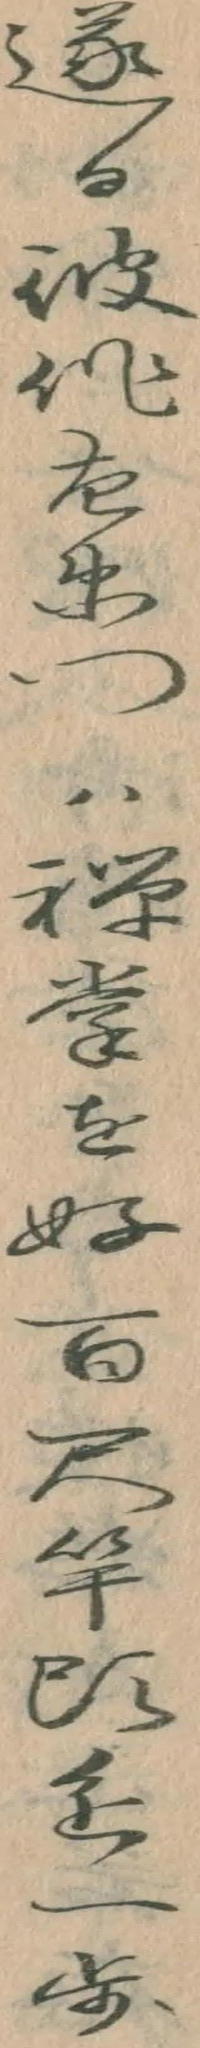遂る彼作左衛門は禅掌を好百尺竿頭進一歩
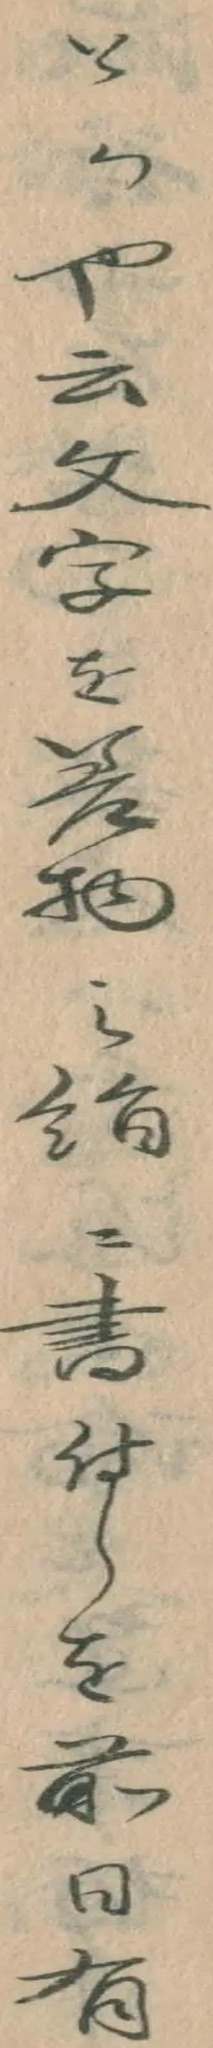とかや云文字を差物之絹に書付しを前日有
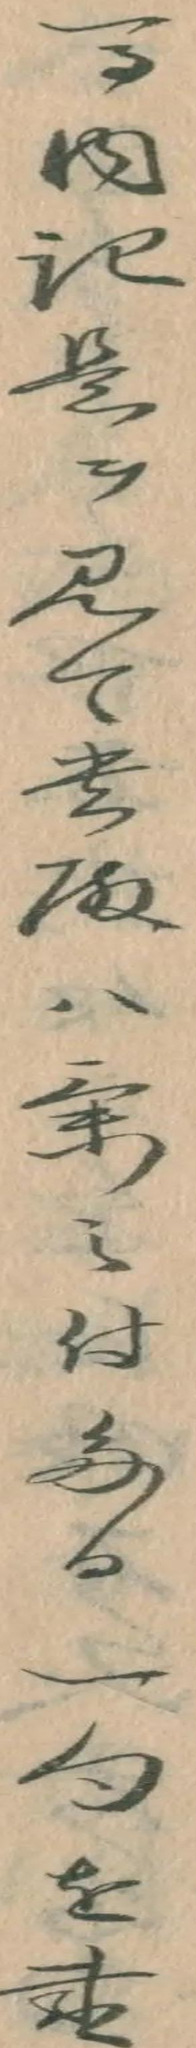馬内記是を見て貴殿は気之付多る一句を書

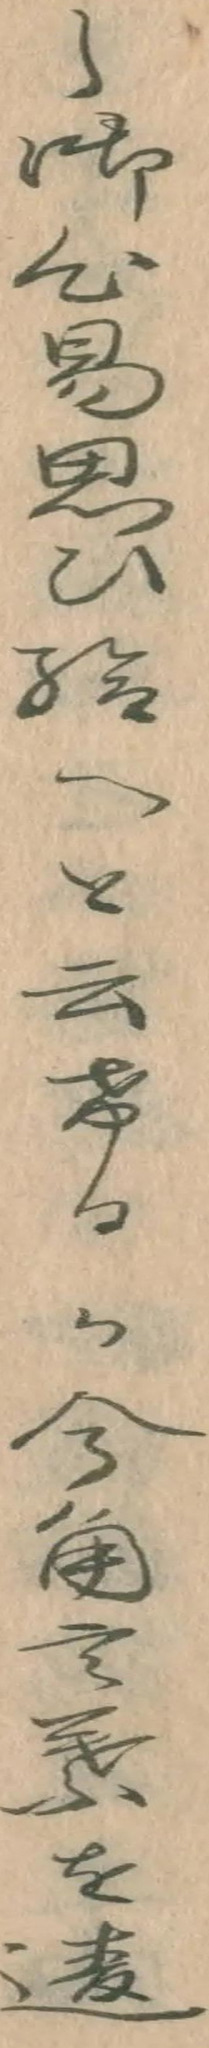し御心易思ひ給へと云希るか今角言葉を違
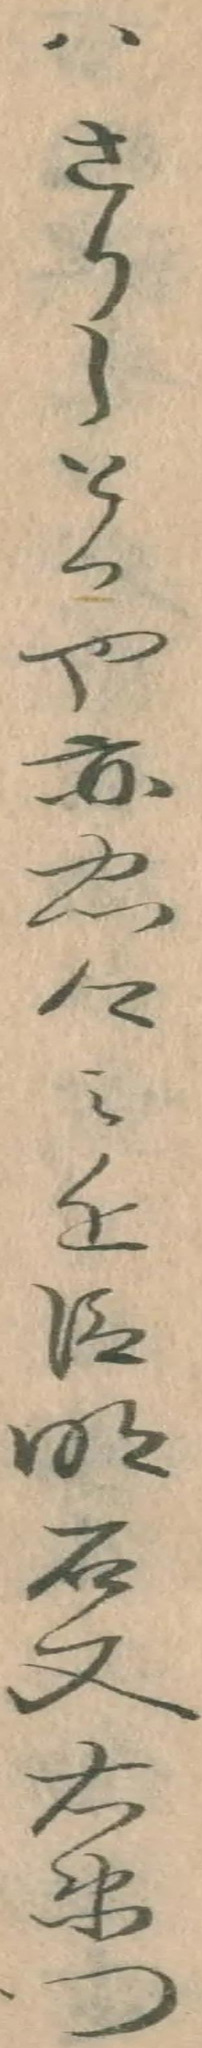はさりしとかや亦忠郷之近臣明石又右衛門
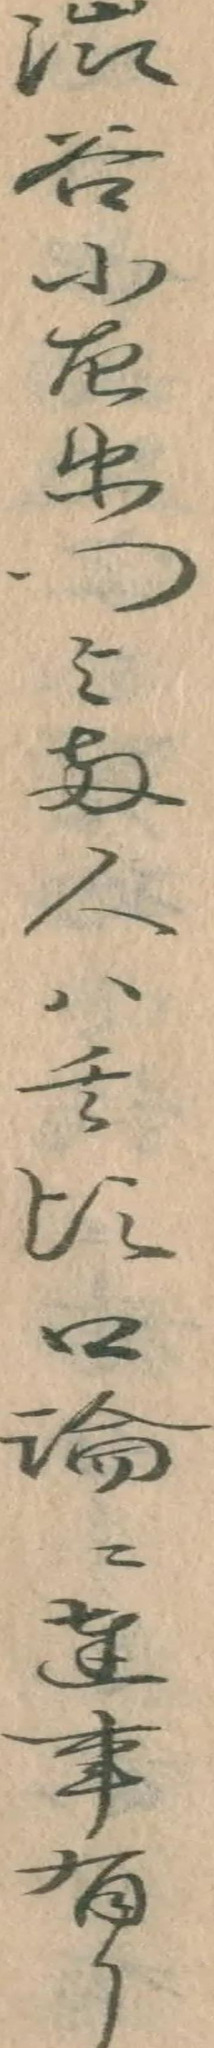渋谷小左衛門与両人は其頃口論に達事有り
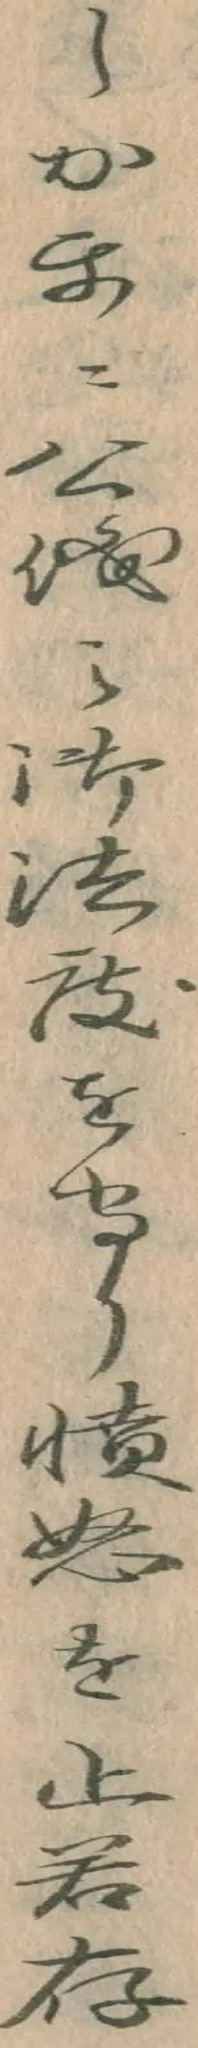しか互に公儀之御法度を守り憤怒を止若存
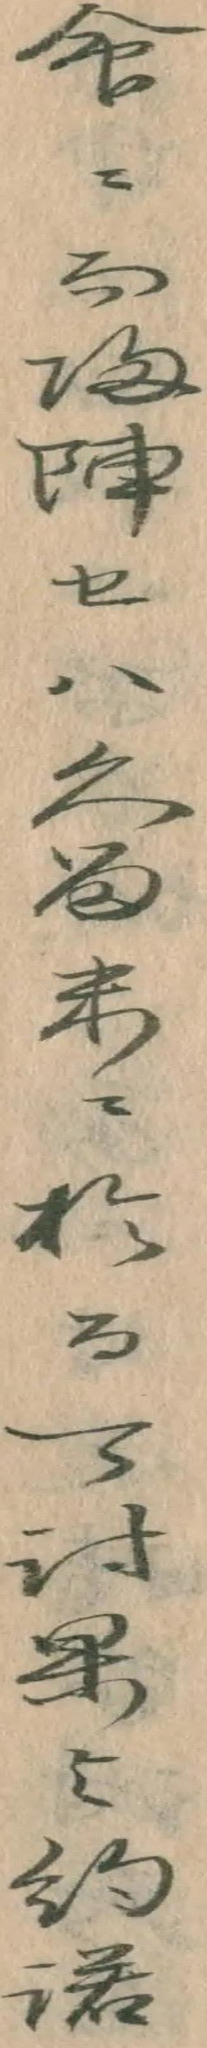命に而帰陣せは久留米に於る可討果与約諾
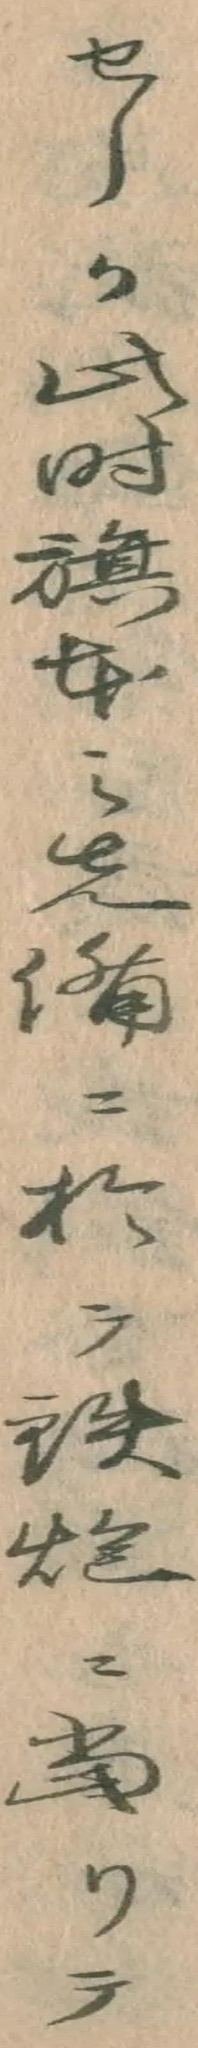せしか此時旗本之先備に於て鉄炮に当りて
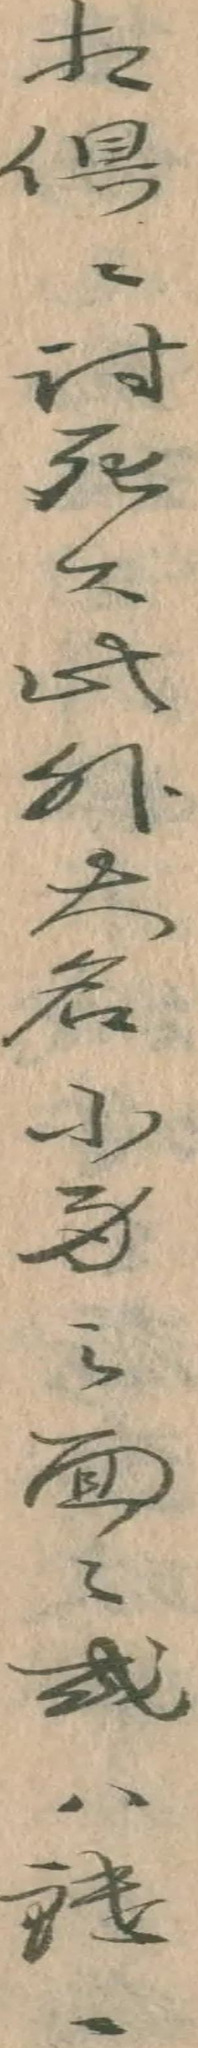相俱に討死す此外大名小身之面々或は鑓に
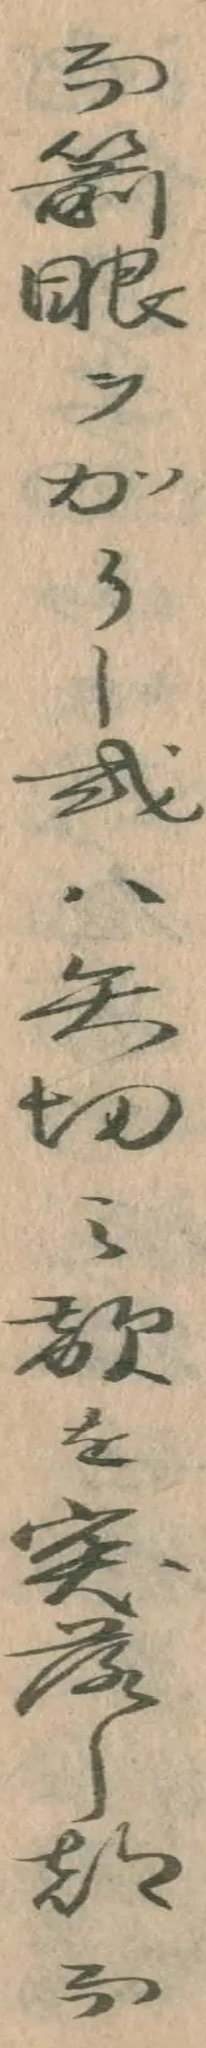而箭眼をからし或は矢切之敵を突落し都而
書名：切支丹御退治記 49巻. [5]
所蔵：国立国会図書館 National Diet Library, JAPAN
